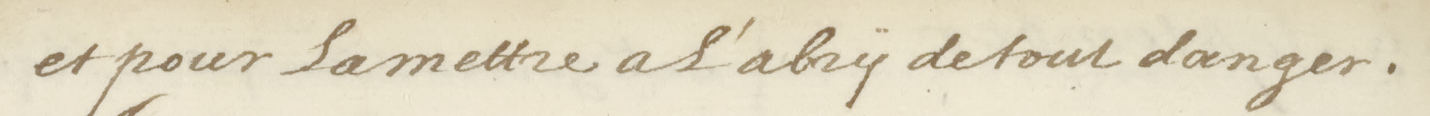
et pour la mettre a l'abrij de tout danger.
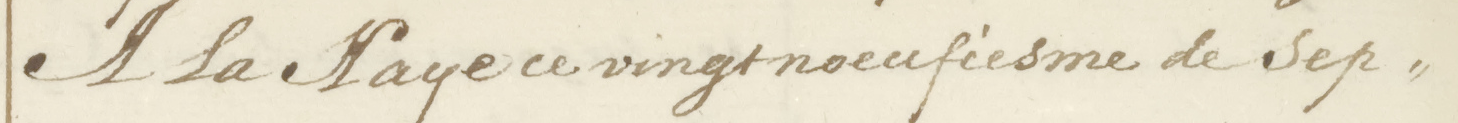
A la Haye ce vingtnoeufiesme de sep„
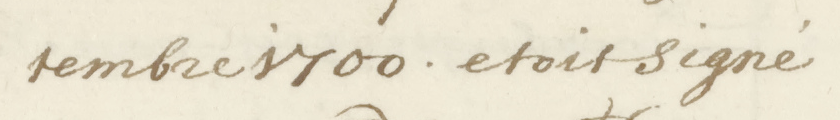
tembre 1700 etoit signé
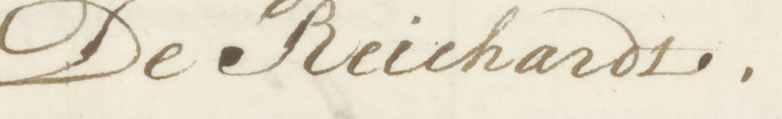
De Reichardt.
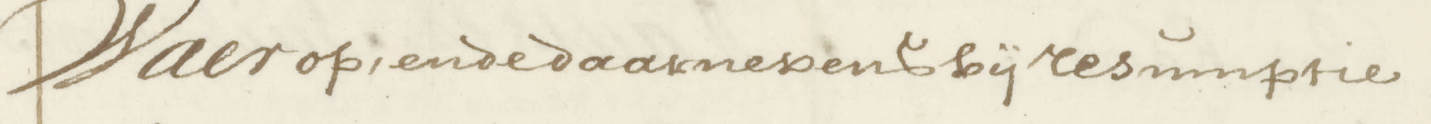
Waer op, ende daarnevens bij resumptie
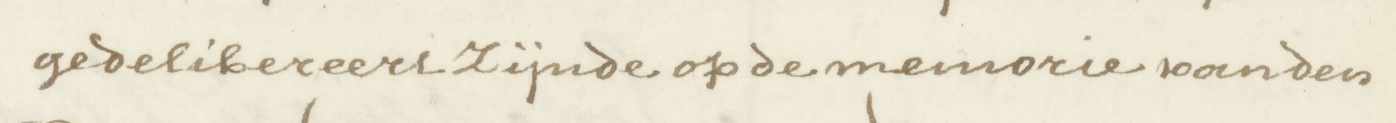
gedelibereert zijnde op de memorie vanden
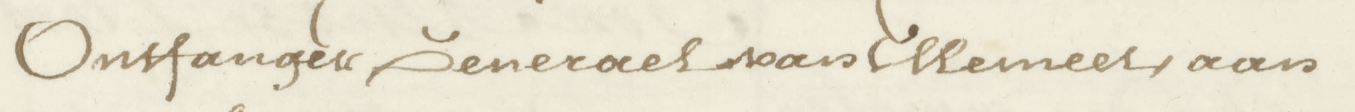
Ontfanger Generael van Ellemeet, aan
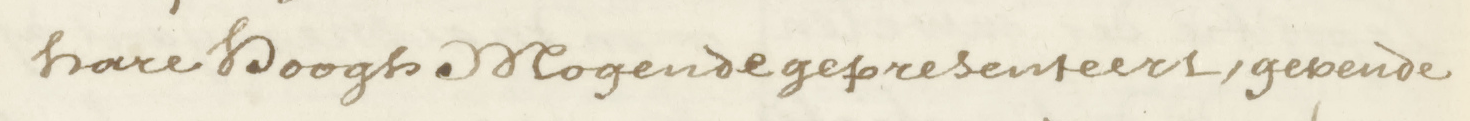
hare Hoogh Mogende gepresenteert, gevende
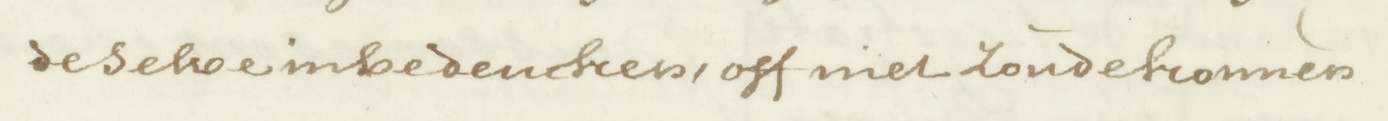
deselve in bedencken, off niet zoude konnen
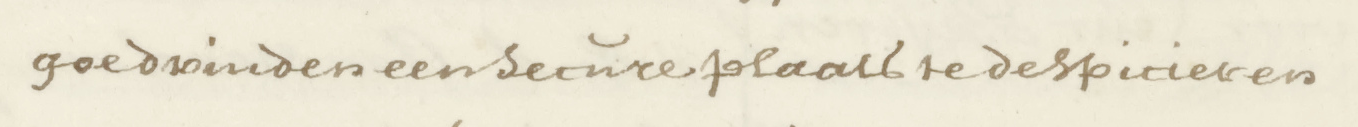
goedvinden een secure plaats te despicieren
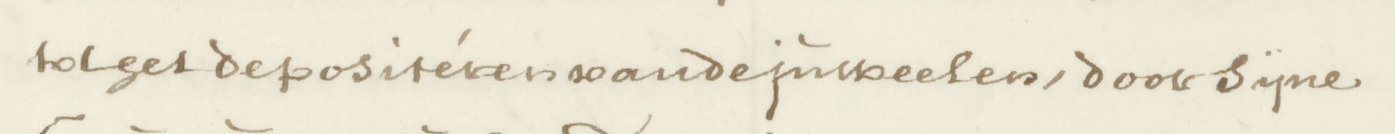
tot het depositeren vande juweelen, door sijne
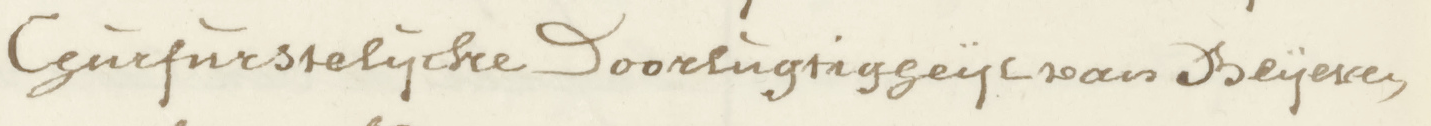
Churfurstelijcke Doorlugtigheijt van Beijeren
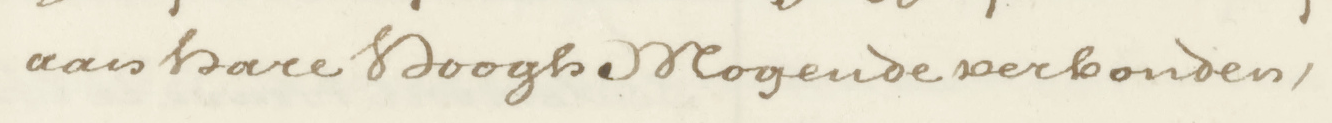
aan hare Hoogh Mogende verbonden,
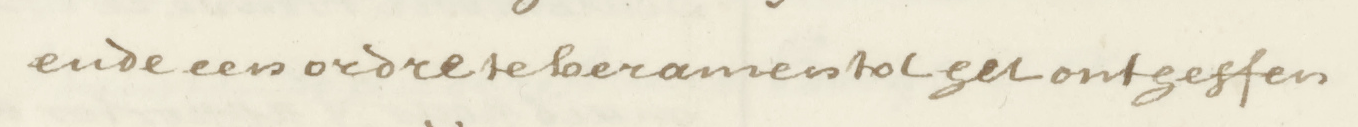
ende een ordre te beramen tot het ontheffen
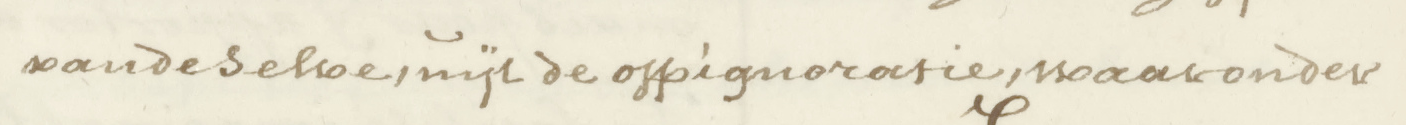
van deselve, uijt de oppignoratie, waaronder
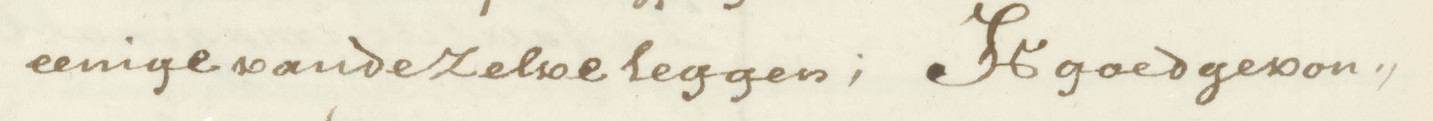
eenige vandezelve leggen: Is goedgevon„
